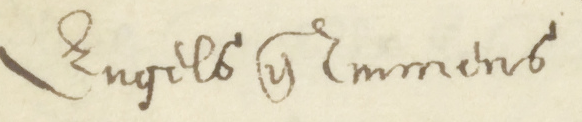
Engels & Emmens
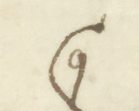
ca
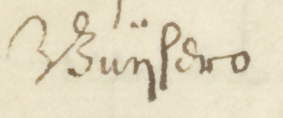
Buijsero
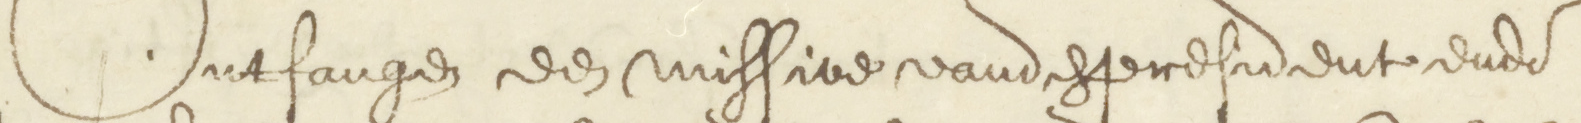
Ontfangen een missive vande president ende
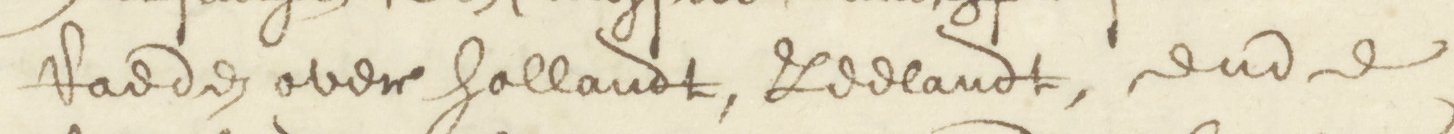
Raeden over Hollandt, Zeelandt, ende
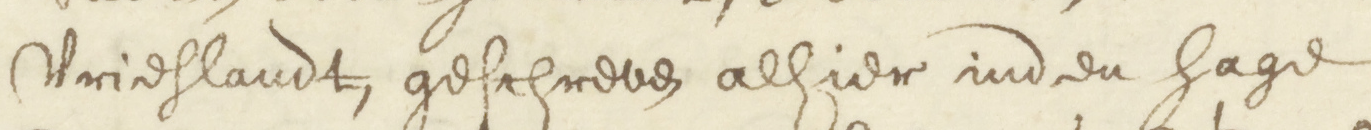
Vrieslandt, geschreven alhier inden hage
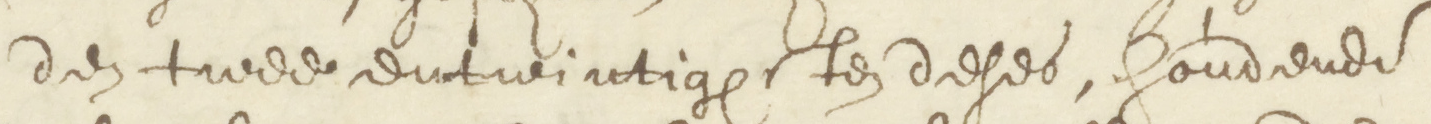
den tweeentwintighsten deses, houdende
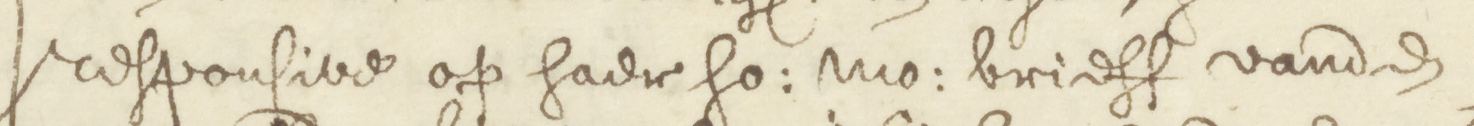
responsive op haer Ho:Mo: brieff vanden
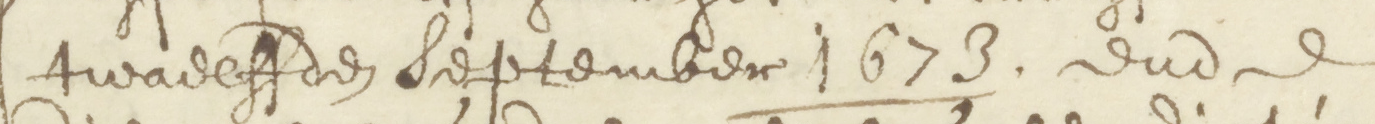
twaelffden September 1673 ende
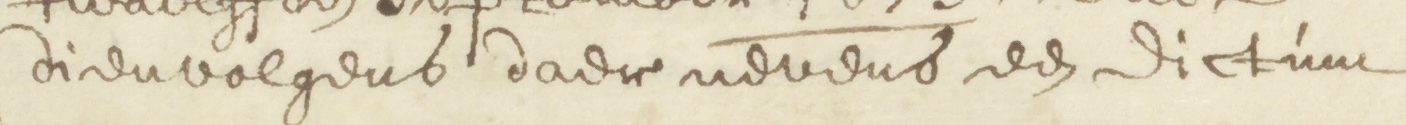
dienvolgens daer nevens een Dictum
